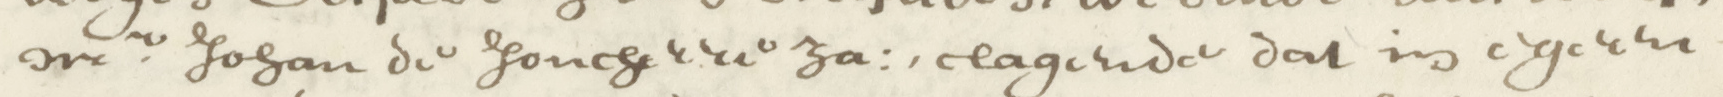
mr. Johan de Jonchere za: , clagende dat in egeen
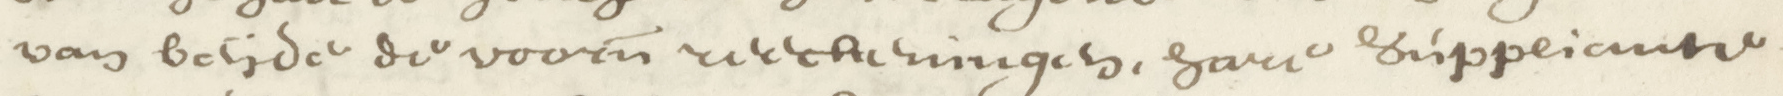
van beijde de voorn reeckeningen hare Suppliante
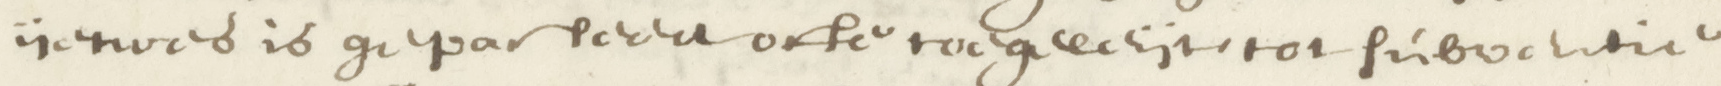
ijetwes is gepasseert ofte toegeleijt tot subventie
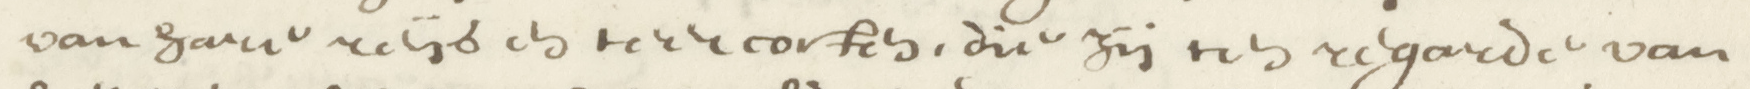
van hare reijs en teercosten, die zij ten regarde van
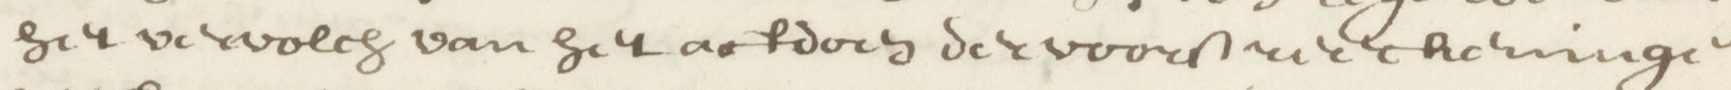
het vervolch van het affdoen der voors reeckeninge
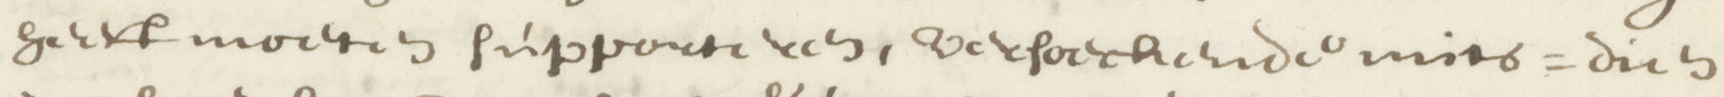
heeft moeten supporteren, versoeckende mits=dien,
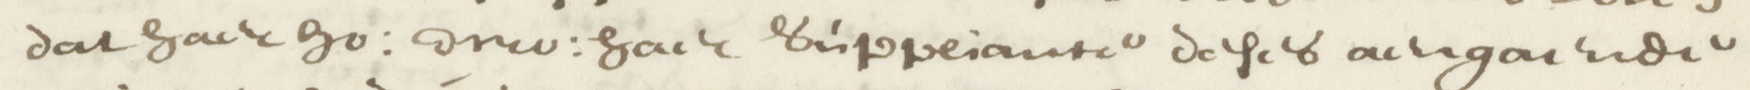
dat haer Ho:Mo: haer Suppliante deses aengaende
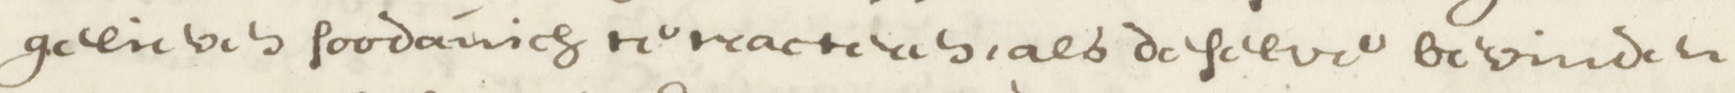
gelieven soodanich te tracteren, als deselve bevinden
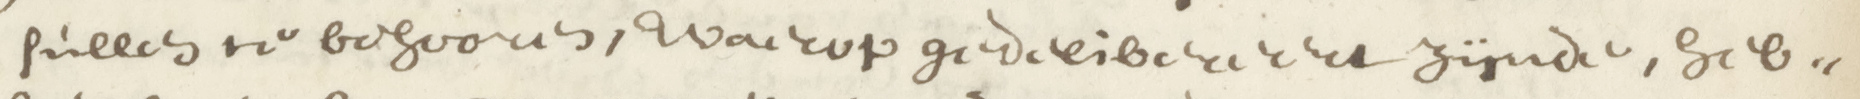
sullen te behooren. Waerop gedelibereert zijnde, heb„
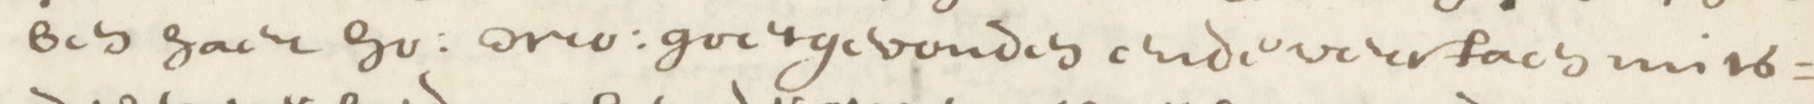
ben haer Ho:Mo: goetgevonden ende verstaen, mits
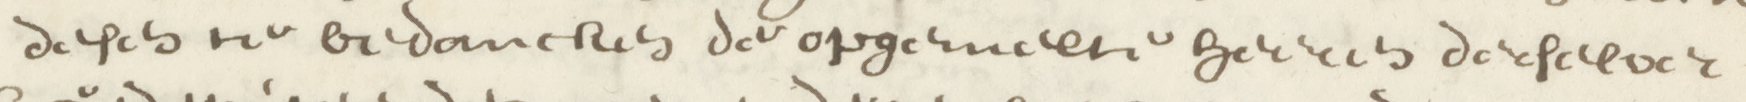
desen te bedancken de opgemelte heeren derselver
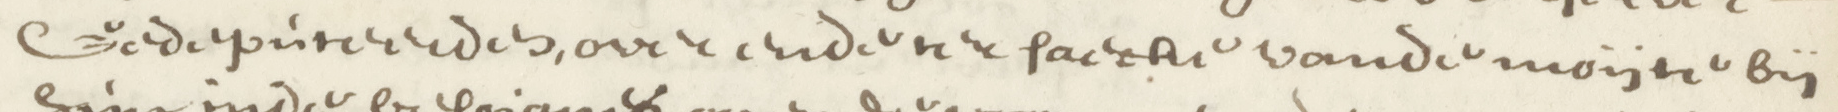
Gedeputeerden over ende ter saecke vande moijte bij
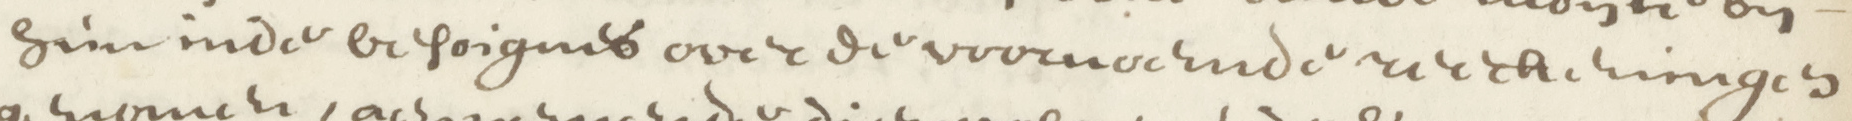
hun inde besoignes over de voornoemde reeckeningen
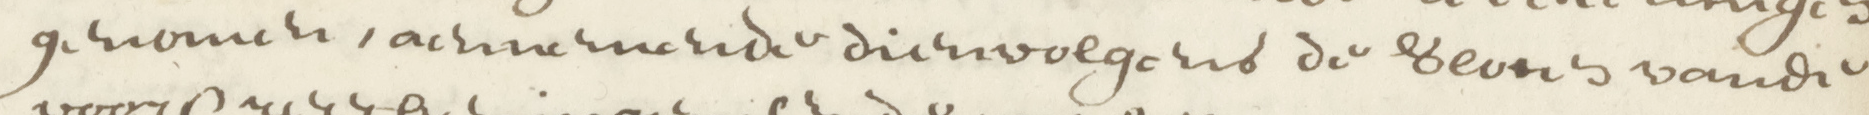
genomen, aennemende dienvolgens de Sloten vande
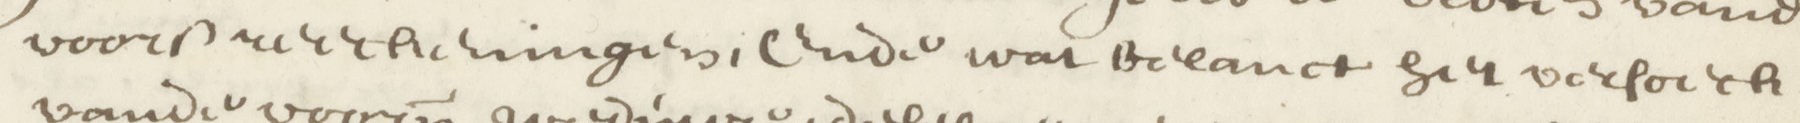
voors reeckeningen. Ende wat belanct het versoeck
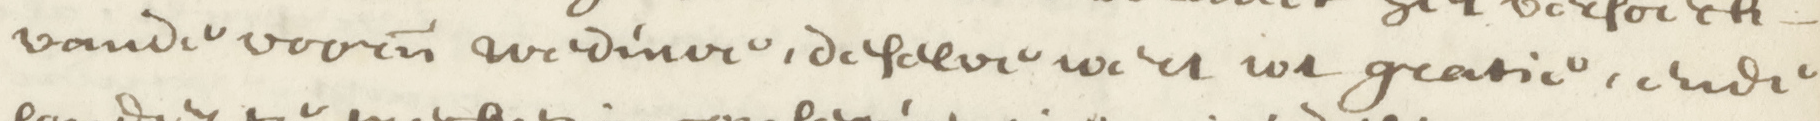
vande voorn weduwe, deselve wert wt gratie, ende
